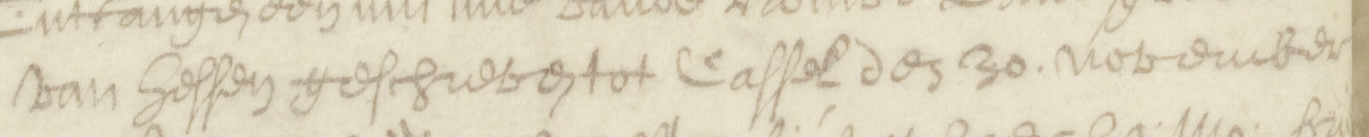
van Hessen geschreven tot Cassel den 30. november
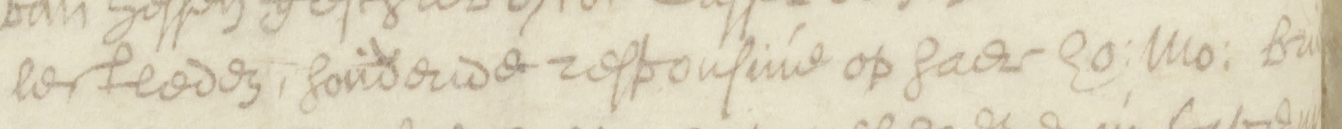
lestleden, houdende responsiue op haer ho:Mo: brie
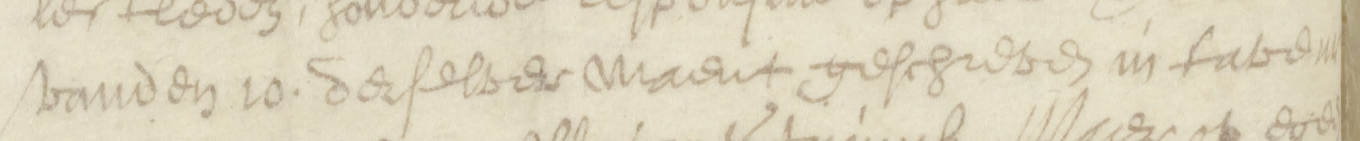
vanden 10. derselver maent geschreven in faveur
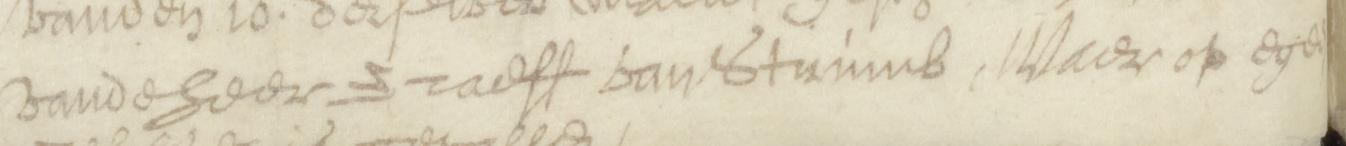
vande heer Graeff van Stirumb. Waer op ege
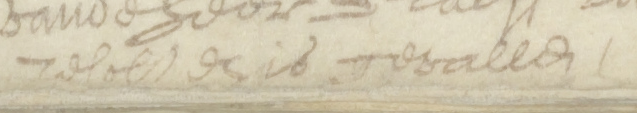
resol en is gevallen.
